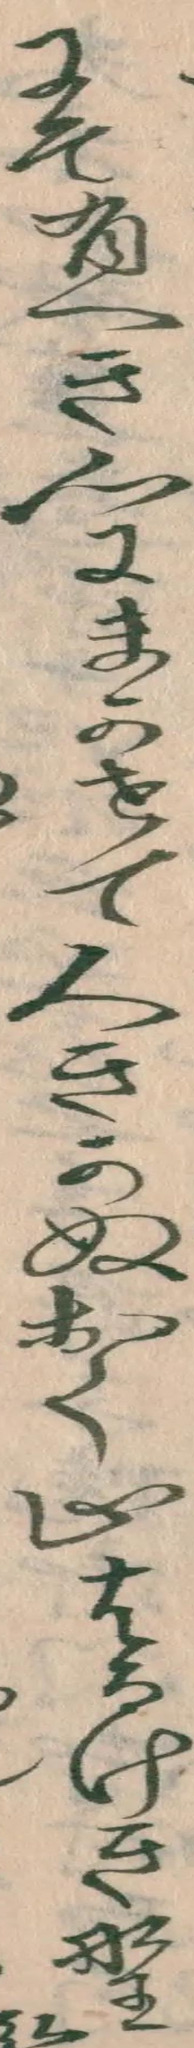にそ有へき心にまかせて人きかぬおく山はるけき野
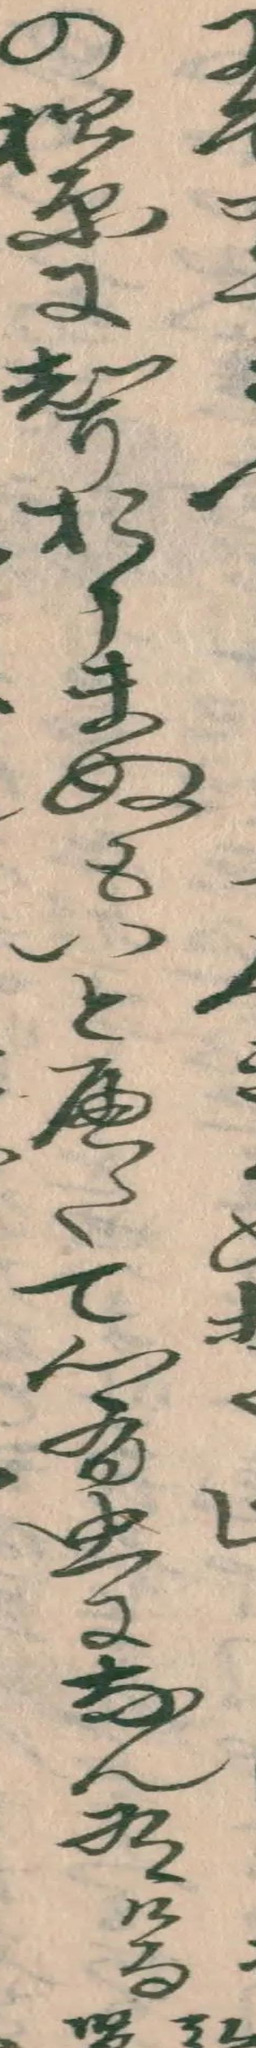の松原に声おしまぬもいとへたて心有虫になん有ける弘賢
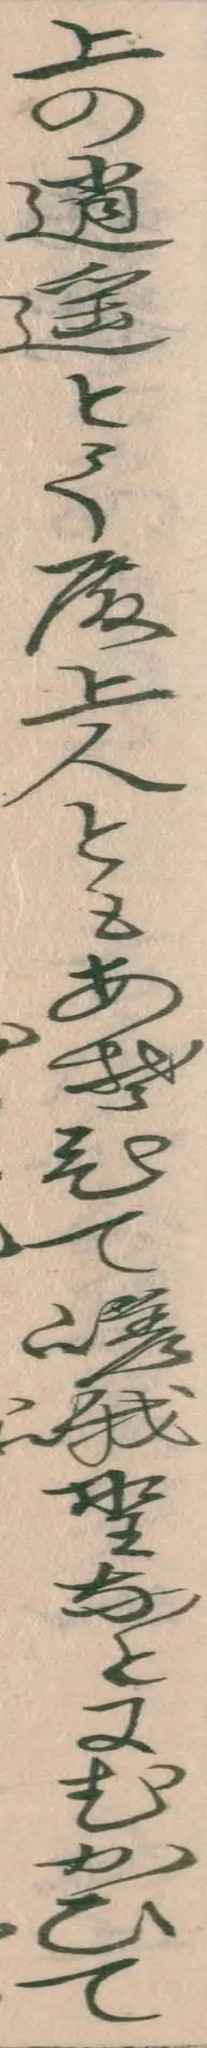上の逍遥とて殿上人ともあそひて嵯峨聖なとにむかひて
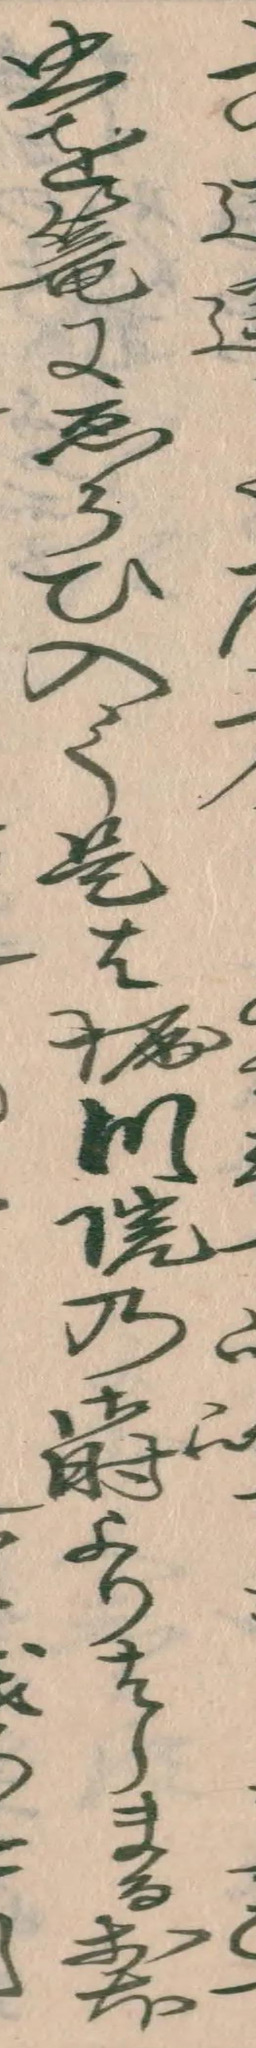虫を篭にゑらひ入て是は堀川院の御時よりはしまるおほ
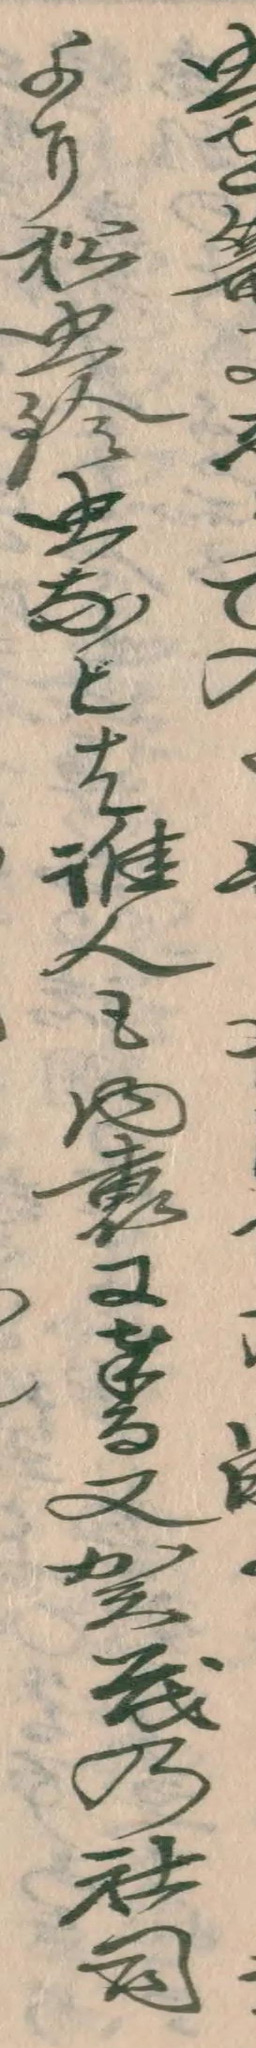よに松虫鈴虫なとは誰人も内裏に奉る又賀我の社司
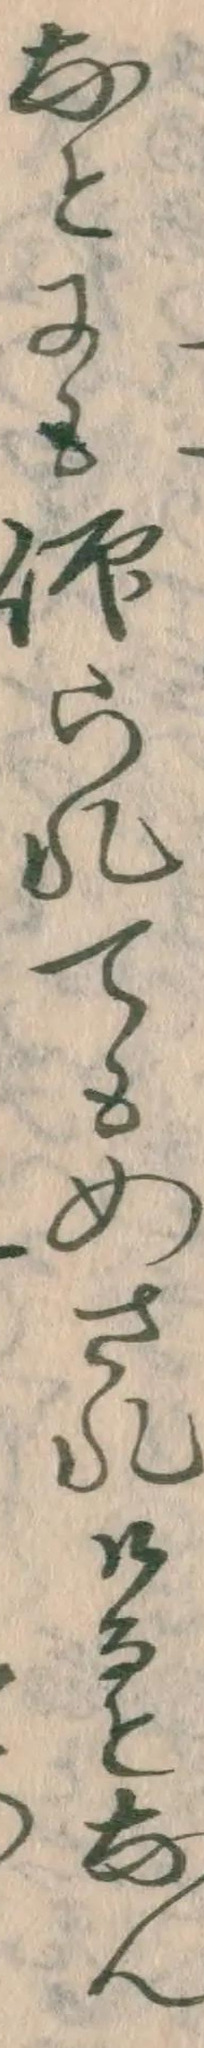なとにも仰られてもめされけるとなん
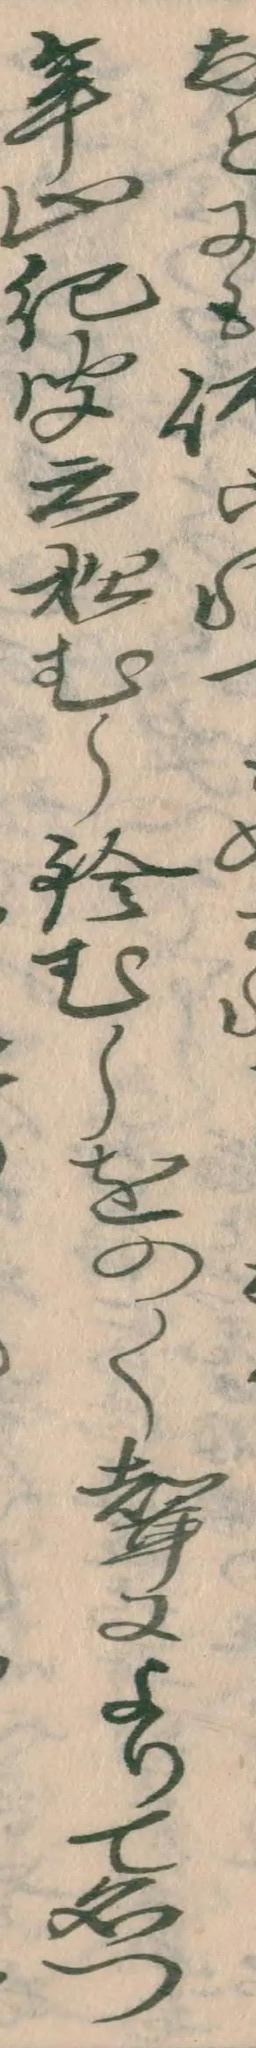年山紀聞云松むし鈴虫をの〱聲によりて名つ
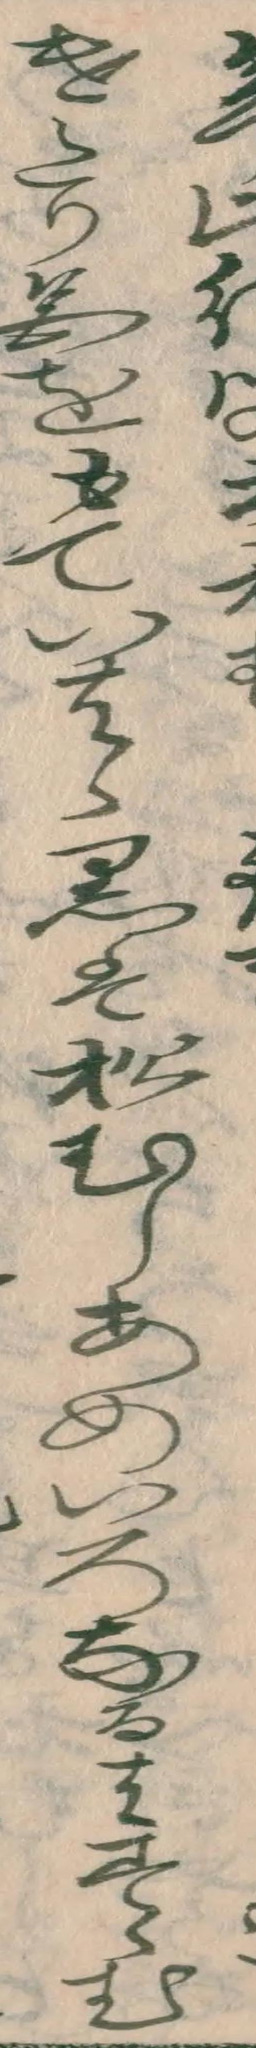けたり色をもいはゝ黒は松むしあめいろなるはすゝむ
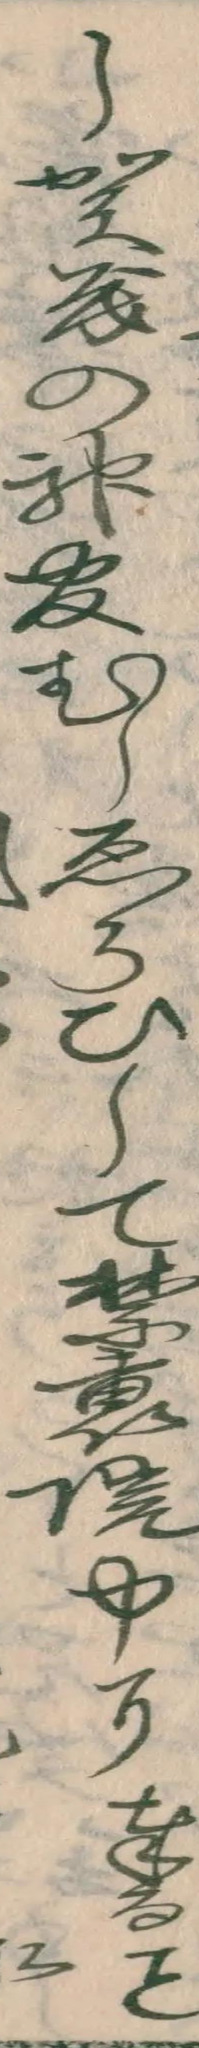し加茂の神官むしゑらひして禁裏院中に奉ること
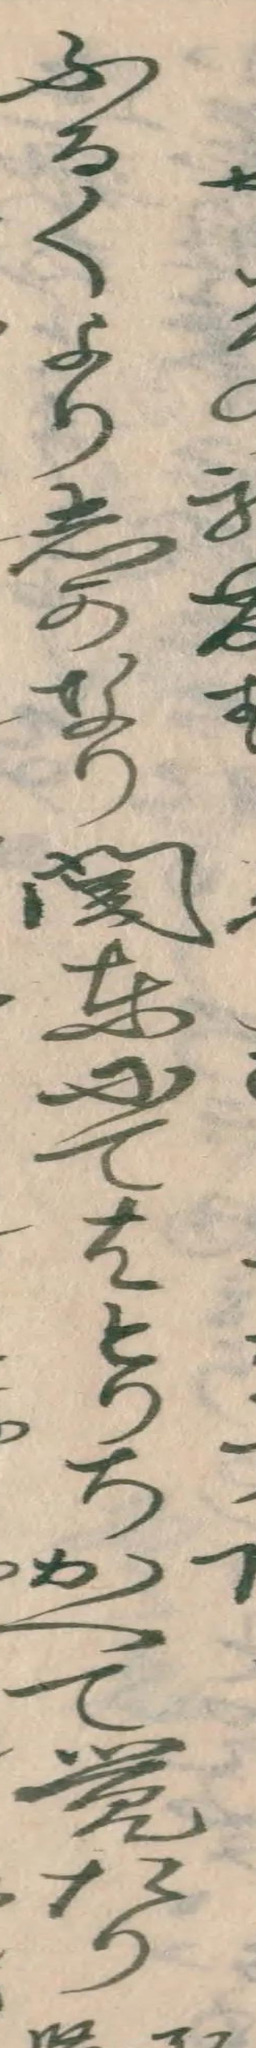ふるくよりしかなり関東にてはとりちかへて覚たり弘賢
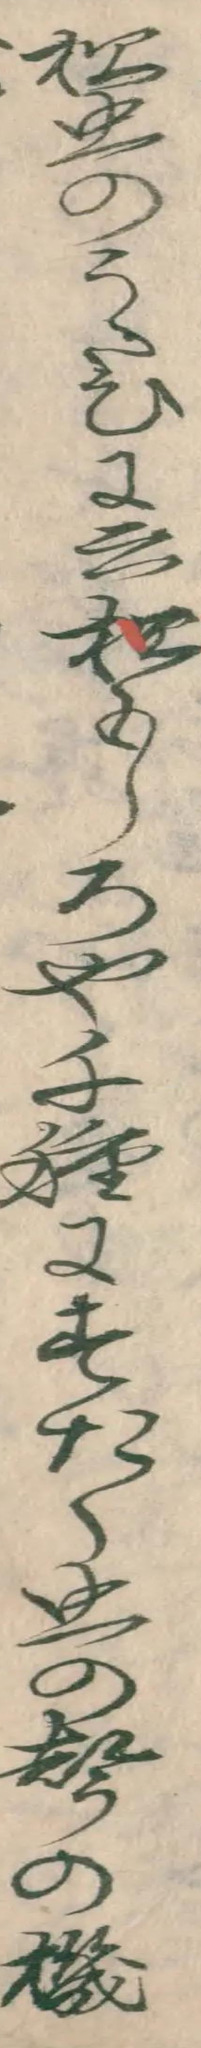松虫のうたひに云おもしろや千種にすたく虫の聲の機
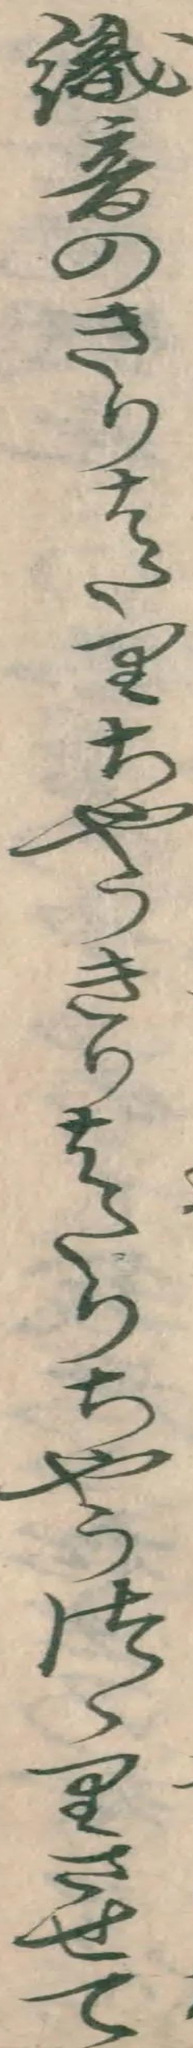織音のきりはたりちやうきりはたりちやうつゝりさせて

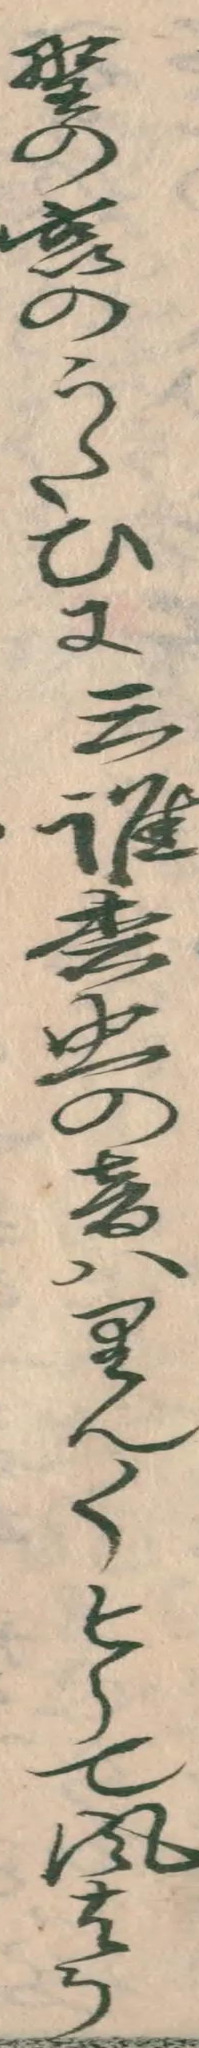野の宮のうたひに云誰松虫の音はりん〱として風はう
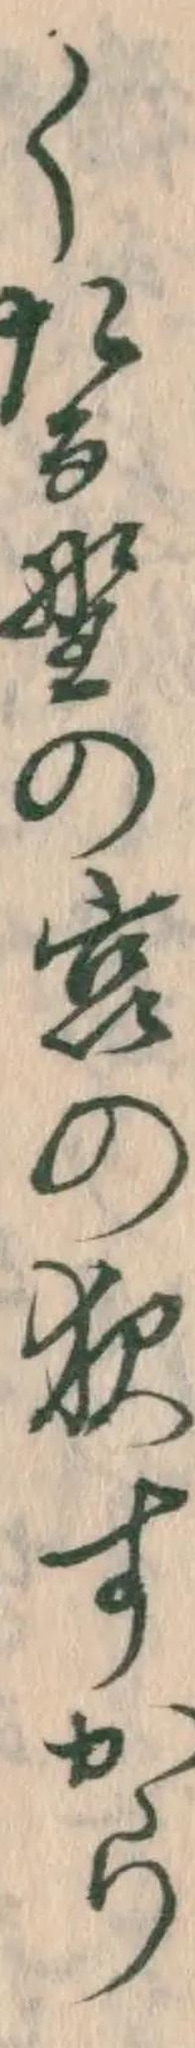〱たる野の宮の夜すから
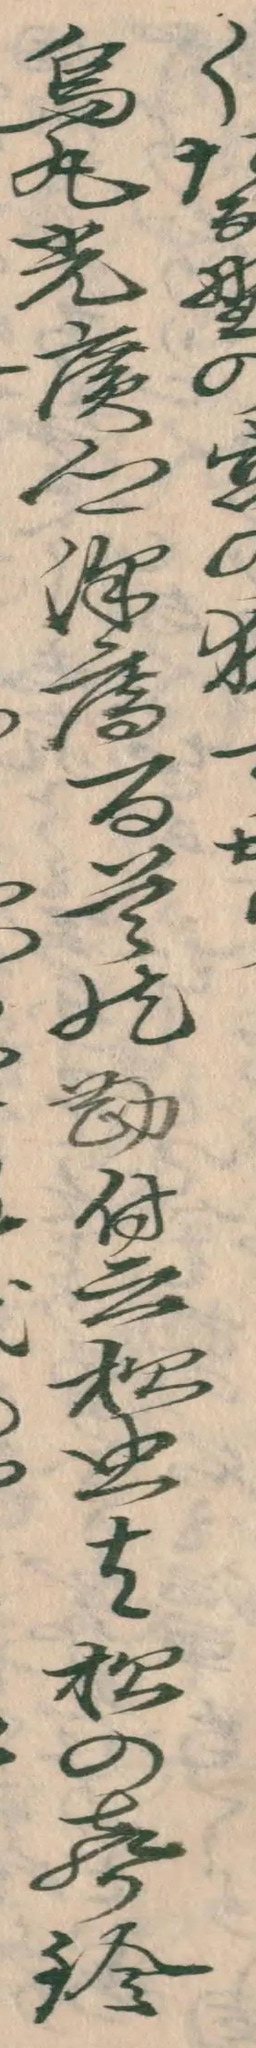烏丸光廣卿澤庵百首の勘付云松虫は松の聲鈴
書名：千蟲譜 3巻. [3]
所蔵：国立国会図書館 National Diet Library, JAPAN
